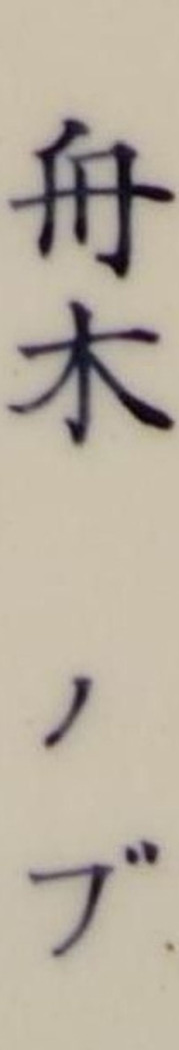舟木ノブ
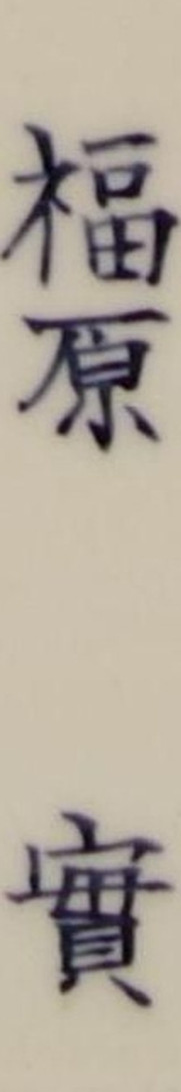福原実
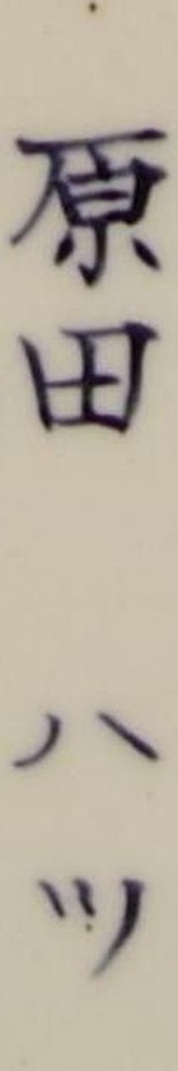原田ハツ
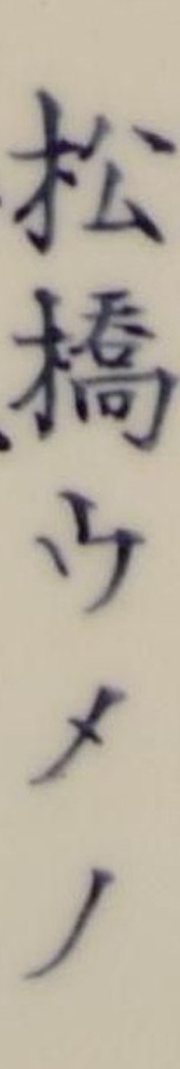松橋ウメノ
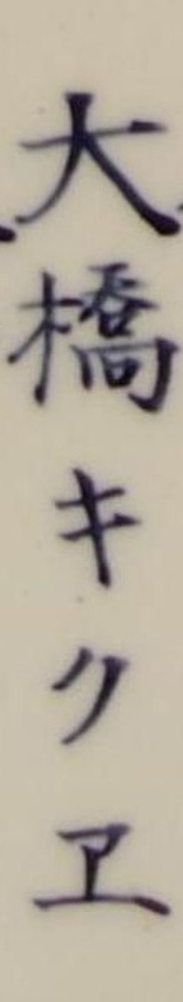大橋キクヱ
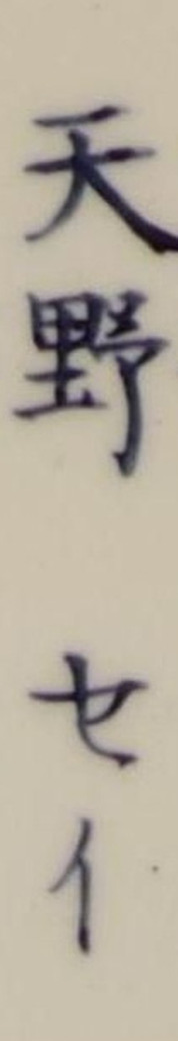天野セイ
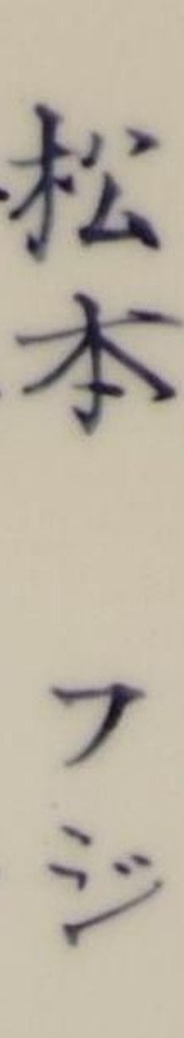松本フジ
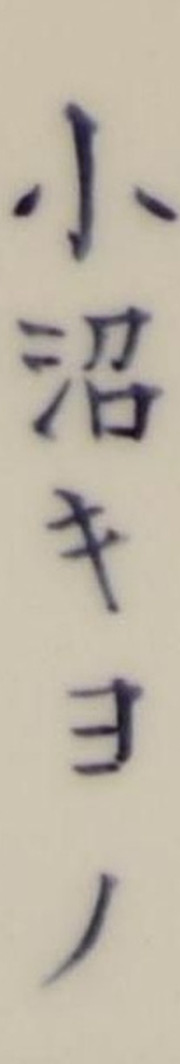小沼キヨノ
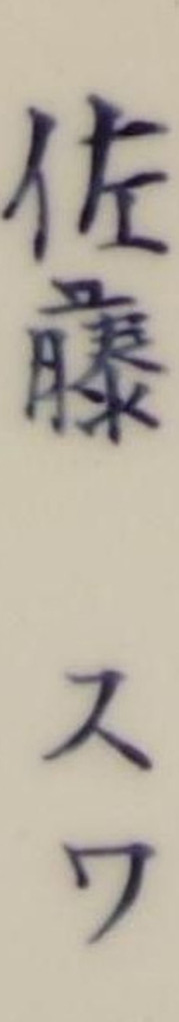佐藤スワ
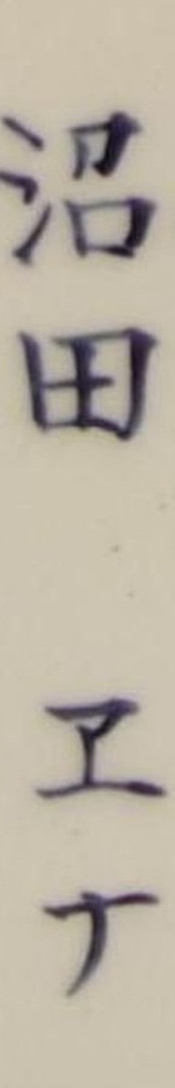沼田ヱナ
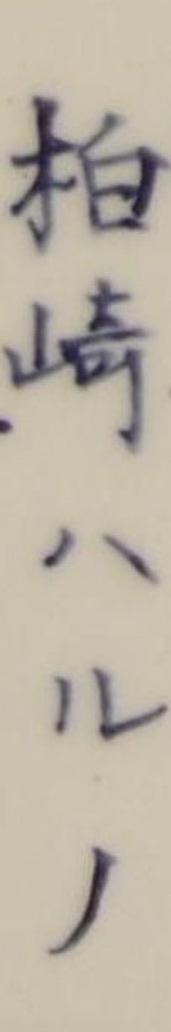柏崎ハルノ
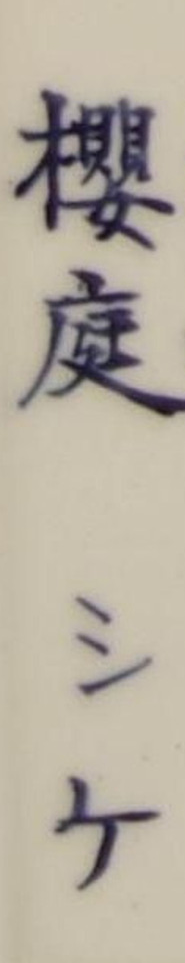桜庭シケ

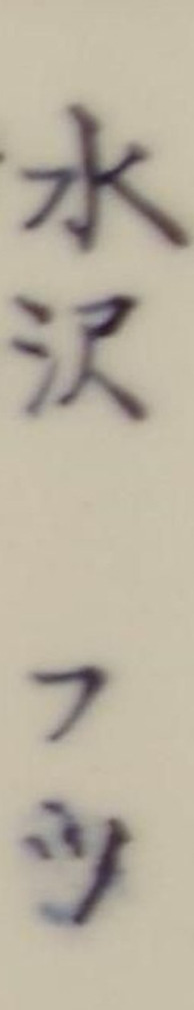水沢フツ
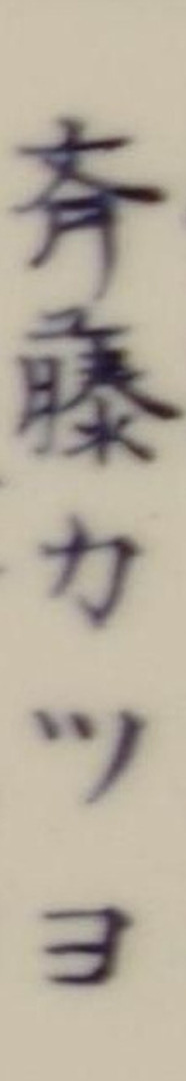斉藤カツヨ
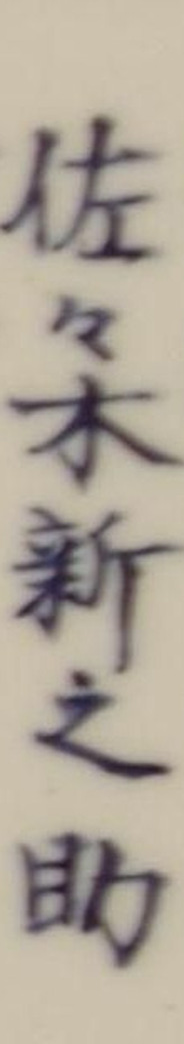佐々木新之助
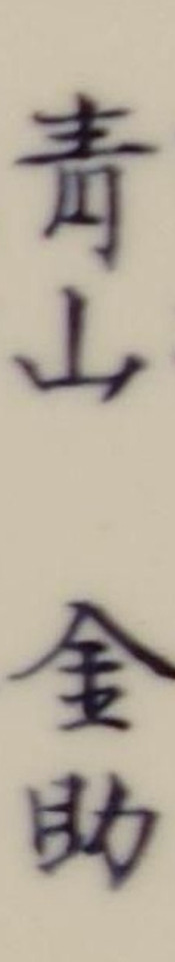青山金助
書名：E~L
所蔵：高野山金剛峯寺
